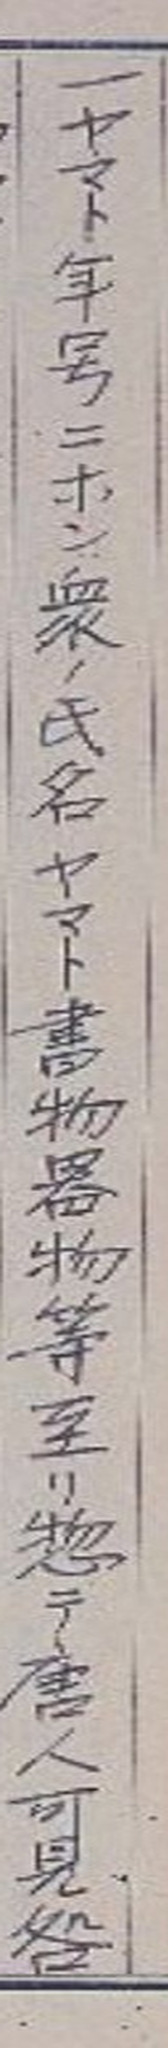一やまと年号にほん衆の氏名やまと書物器物等至り惣て唐人可見咎
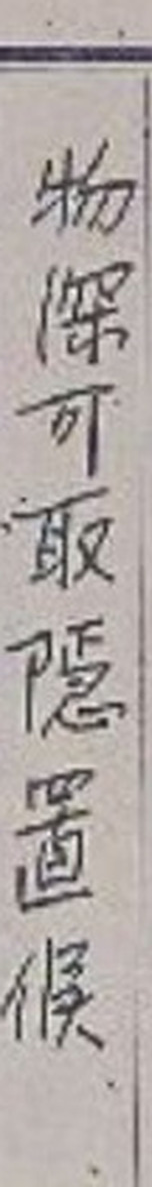物深可取隠置候
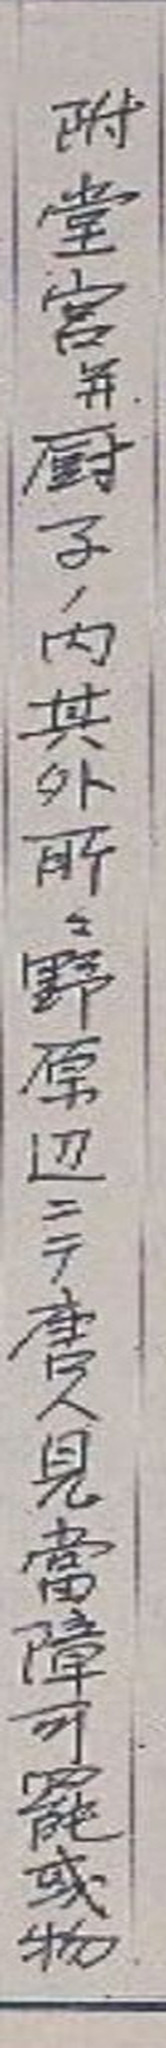附堂宮并厨子の内其外所々野原辺にて唐人見当障可罷或物
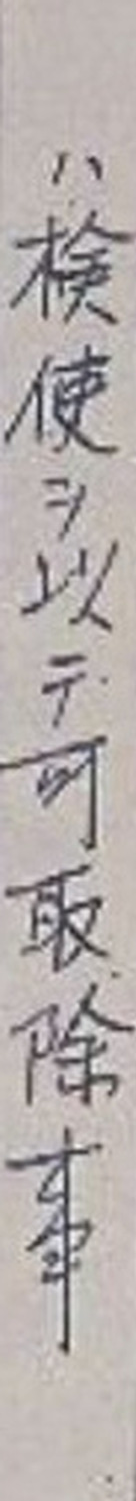は検使を以て可取除事
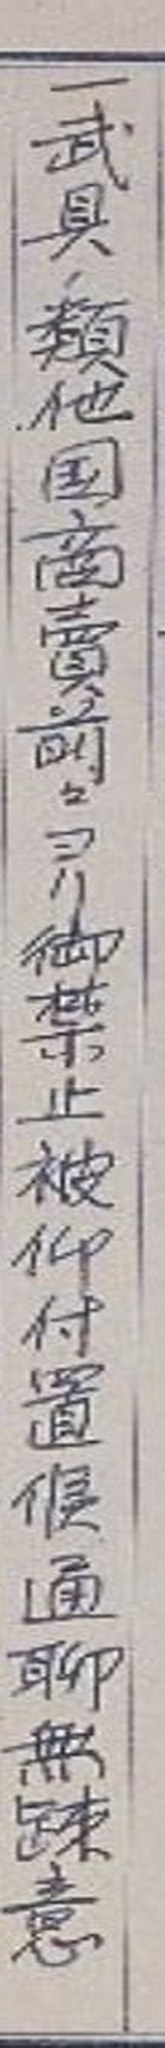一武具の類他国商売前々より御禁止被仰付置候通聊無疎意
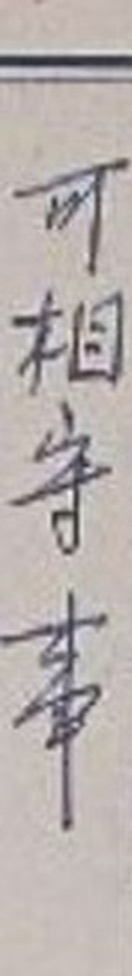可相守事
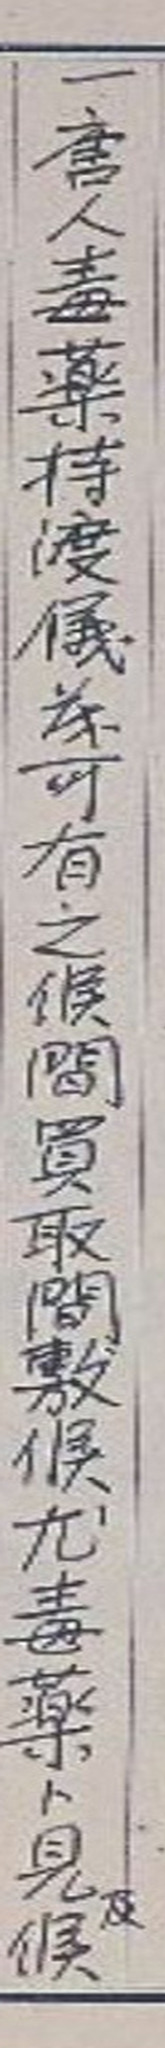一唐人毒薬持渡儀も可有之候間買取間敷候尤毒薬と見及候
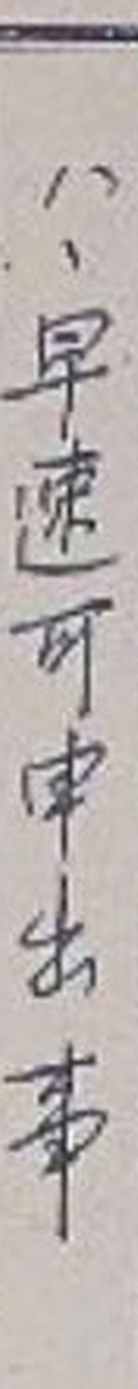はゝ早速可申出事
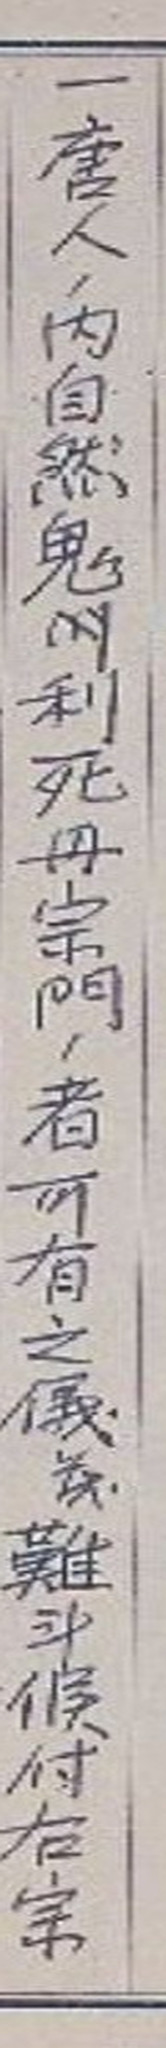一唐人の内自然鬼利死丹宗門の者可有之儀も難計候付右宗
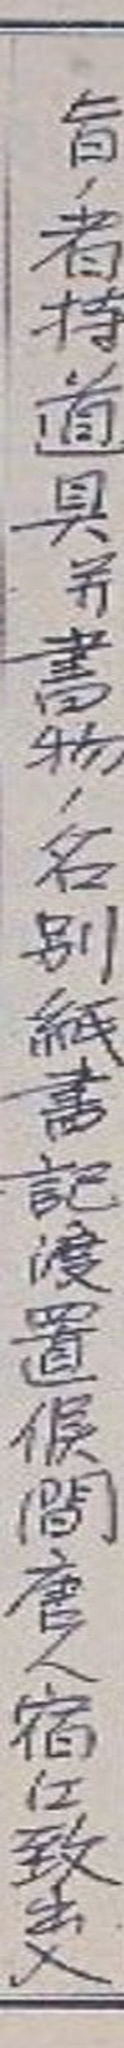旨の者持道具并書物の名別紙書記渡置候間唐人宿え致出入
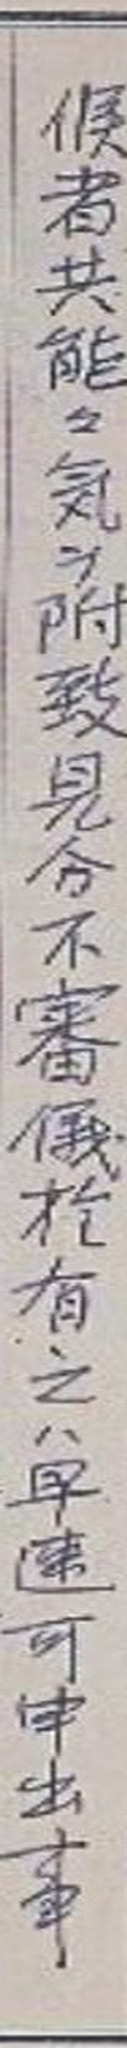候者共能々気を附致見分不審儀於有之は早速可申出事
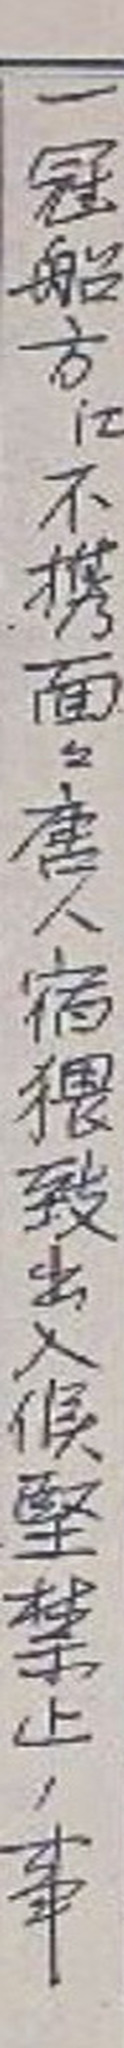一冠船方え不携面々唐人宿猥致出入候堅禁止の事
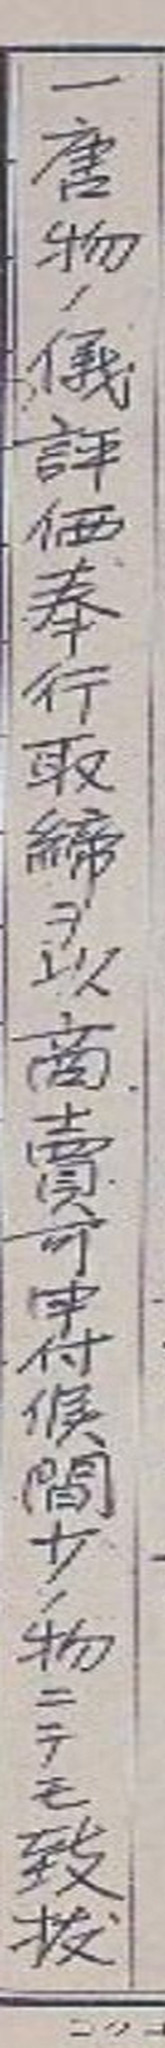一唐物の儀評価奉行取締を以商売可申付候間少の物にても致抜
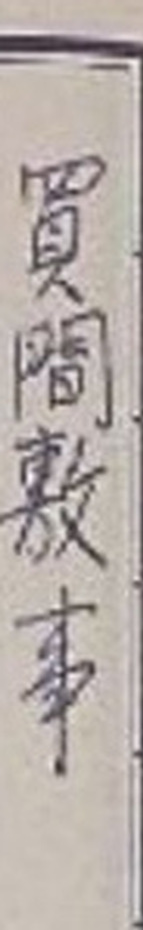買間敷事
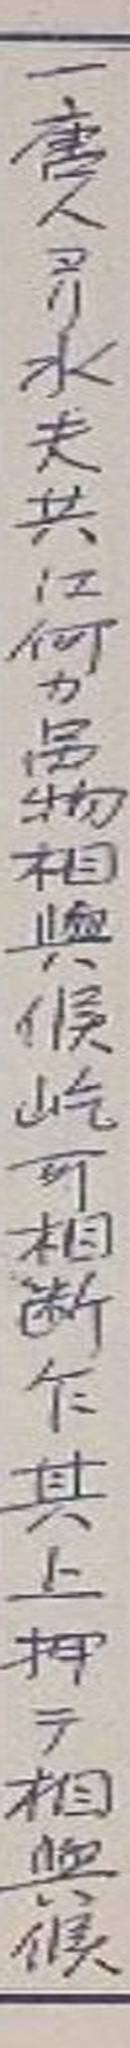一唐人より水夫共え何か品物相与候屹可相断乍其上押て相与候
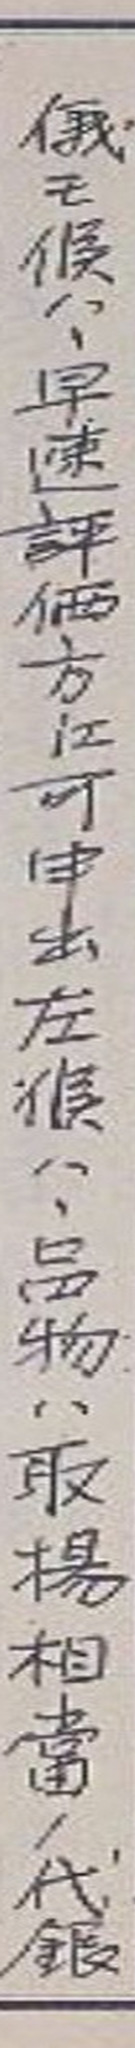儀も候はゝ早速評価方え可申出左候はゝ品物は取揚相当の代銀
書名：支那冊封使来琉諸記 下巻
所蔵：University of the Ryukyus Library
